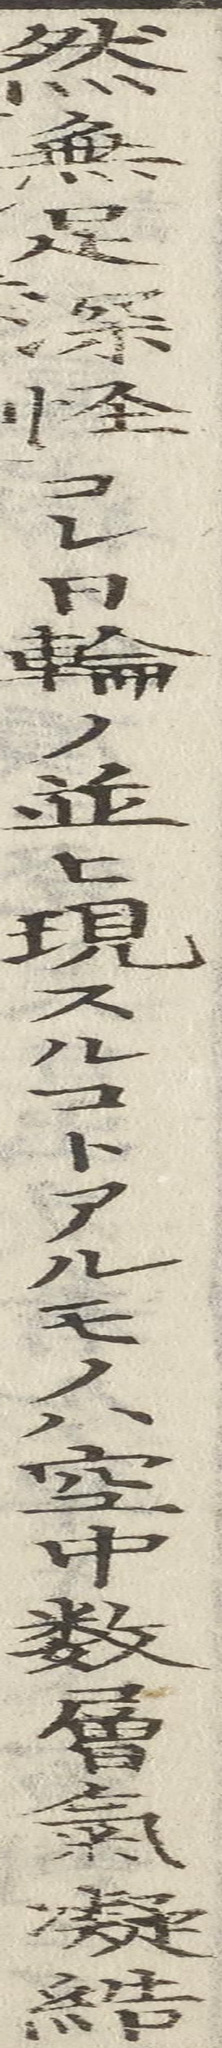然無足ニ深怪コレ日輪ノ並ヒ現スルコトアルモノハ空中数層気凝結
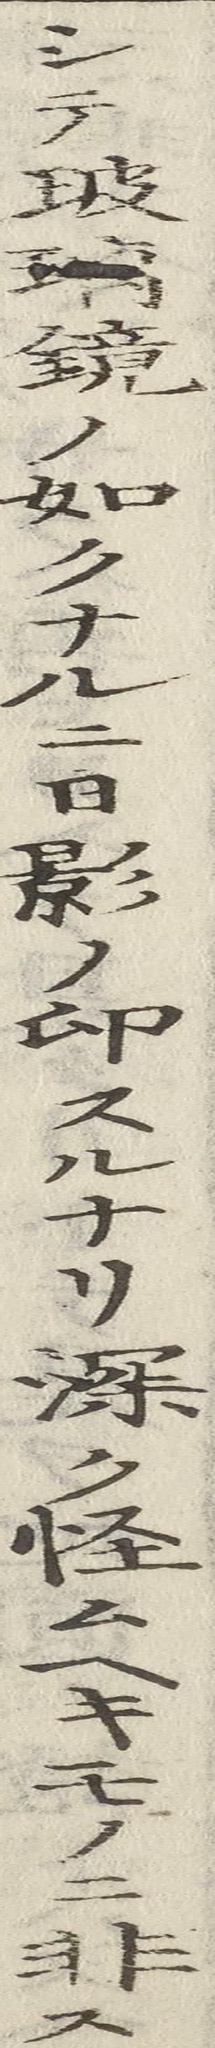シテ玻璃鏡ノ如クナルニ日影ノ卬スルナリ深ク怪ムヘキモノニ非ス
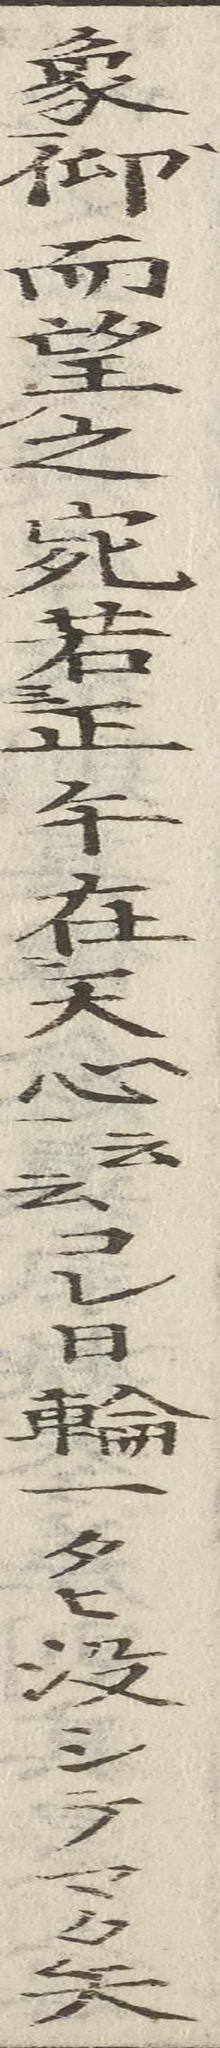象仰而望之宛若正午在ニ天心云云コレ日輪一タヒ没シテマタ天

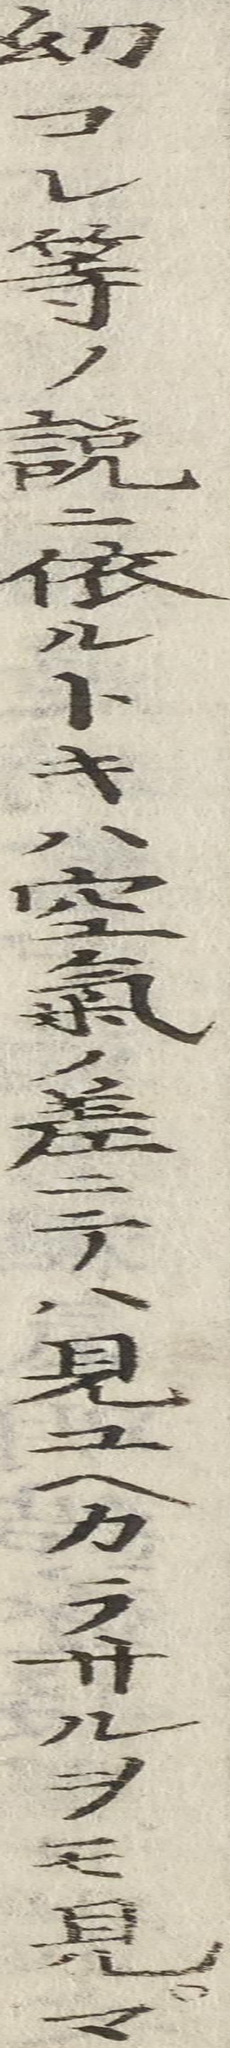幼コレ等ノ説ニ依ルトキハ空気ノ差ニテハ見ユヘカラサルヲモ見。マ
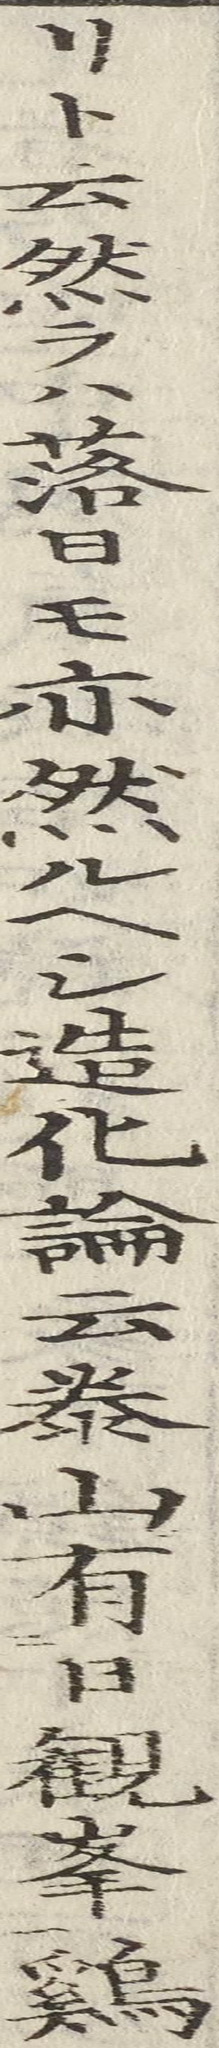リト云然ラハ落日モ亦然ルヘシ造化論云泰山有ニ日観峯鶏
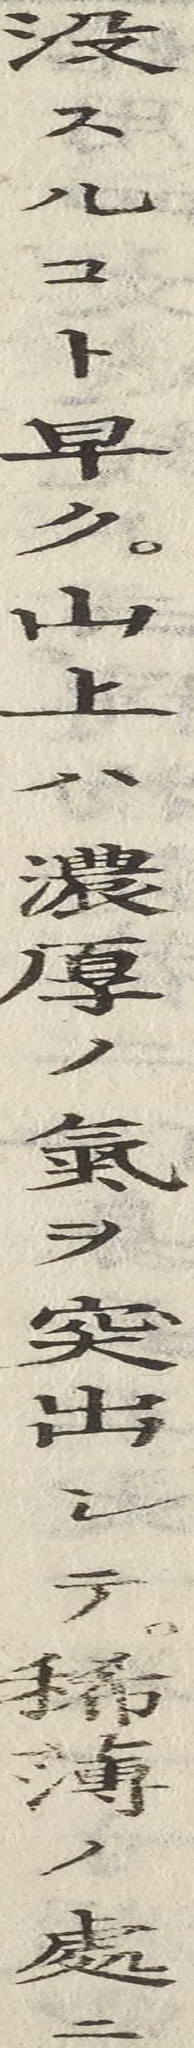没スルコト早ク。山上ハ濃厚ノ気ヲ突出シテ。稀薄ノ処ニ
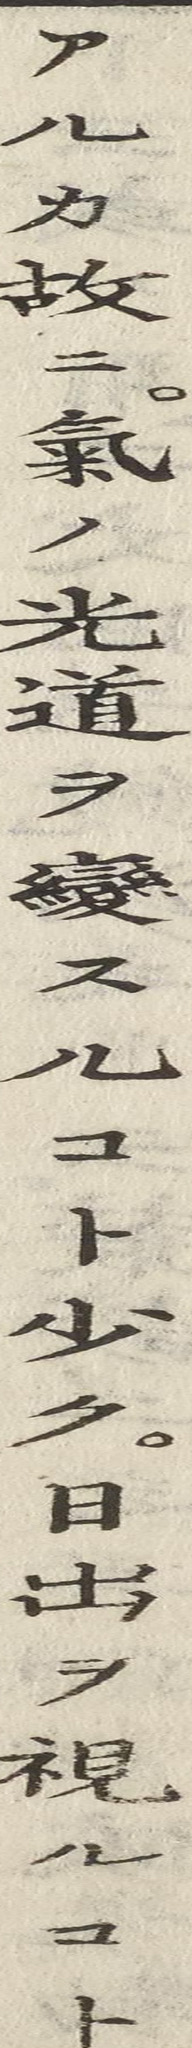アルカ故ニ。気ノ光道ヲ変スルコト少ク。日出ヲ視ルコト
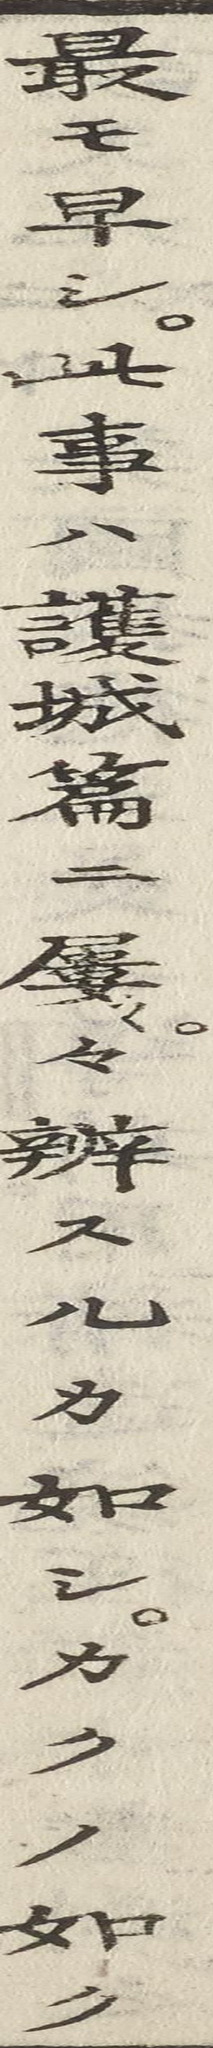最モ早シ。此事ハ護城篇ニ屢〱。々弁スルカ如シ。カクノ如ク
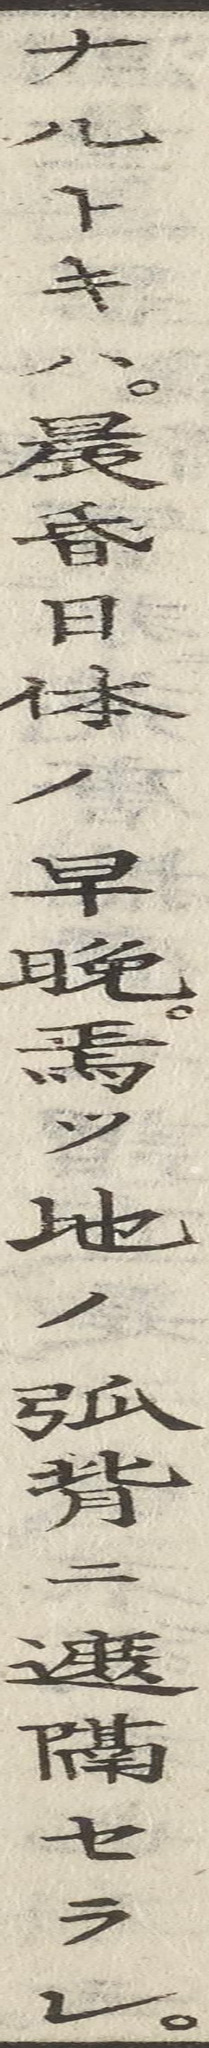ナルトキハ。晨昏日体ノ早晩。焉ツ地ノ弧背ニ遮隔セラレ。
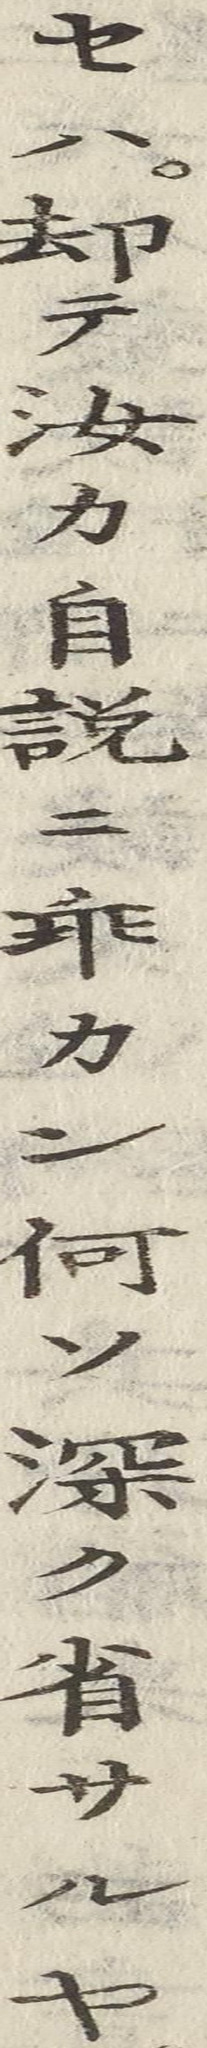セハ。却テ汝カ自説ニ乖カン何ソ深ク省サルヤ。
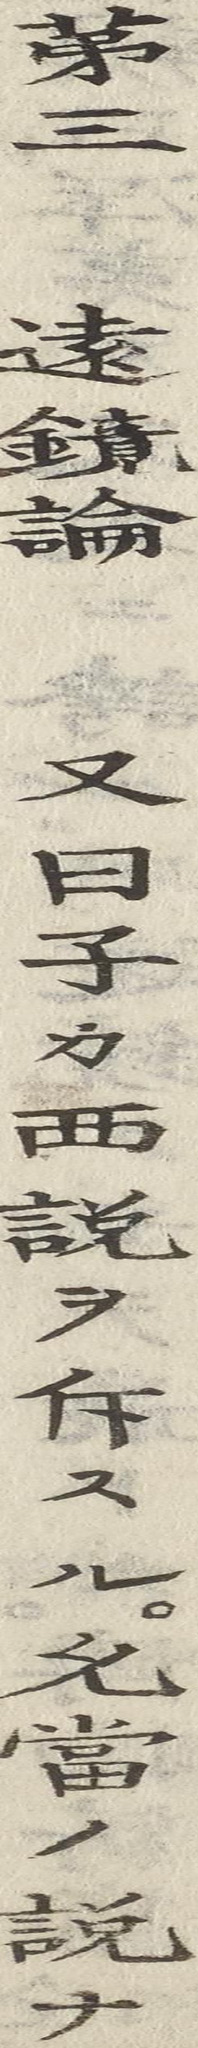第三遠鏡論又曰子カ西説ヲ斥スル。允当ノ説ナ
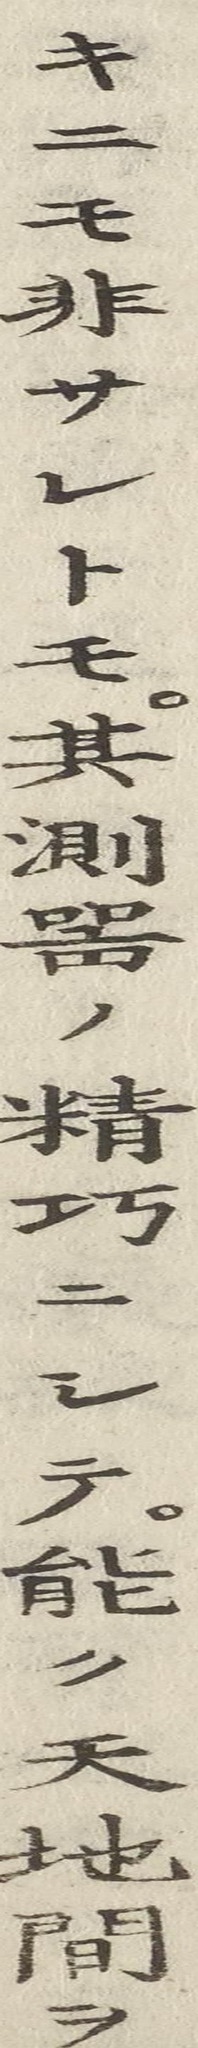キニモ非サレトモ。其測器ノ精巧ニシテ。能ク天地間ヲ
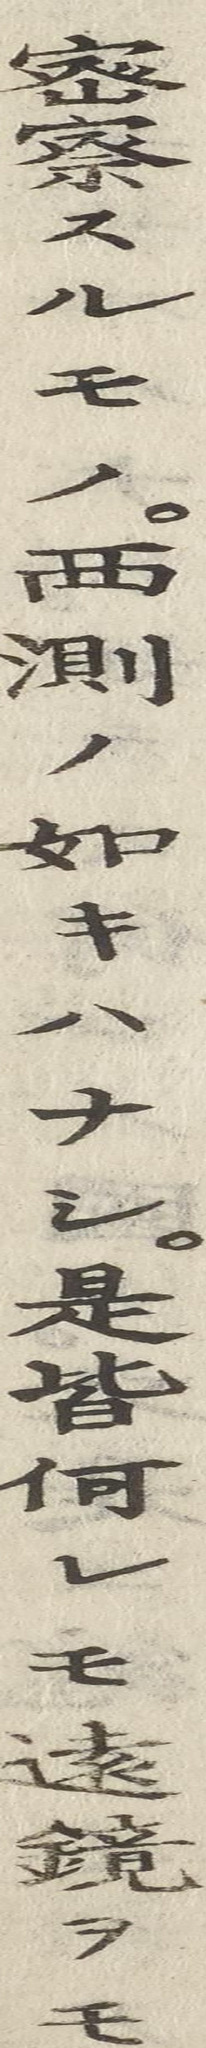密察スルモノ。西測ノ如キハナシ。是皆何レモ遠鏡ヲモ

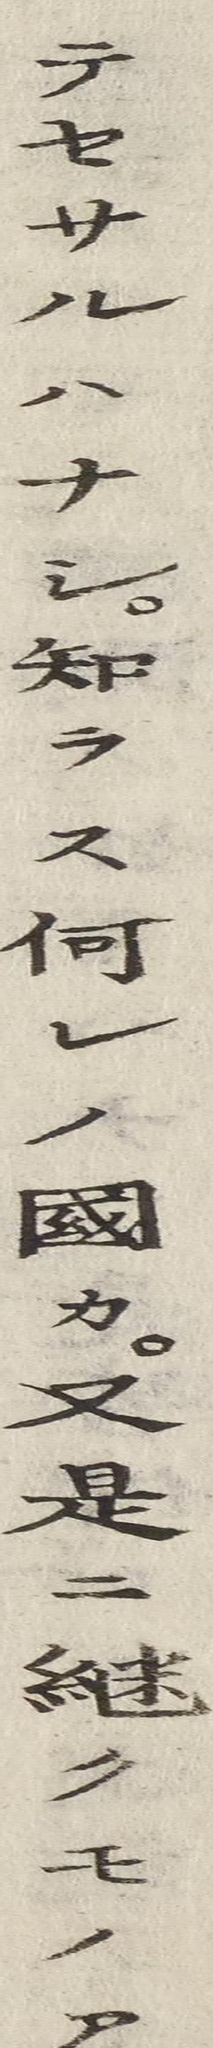テセサルハナシ。知ラス何レノ国カ。又是ニ継クモノア
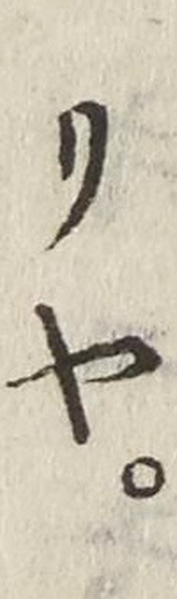リヤ。
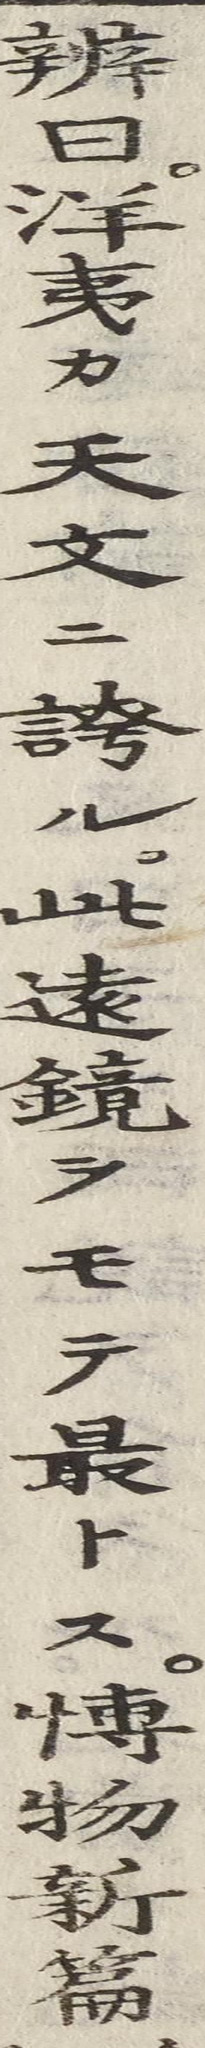弁曰。洋夷カ天文ニ誇ル。此遠鏡ヲモテ最トス。博物新篇全部
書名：護法新論　二編　下
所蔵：東京大学地震研究所図書室 Earthquake Research Institute Library, The University of Tokyo, JAPAN
